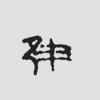隹
